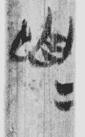首=
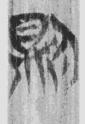則
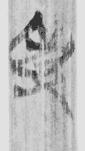事
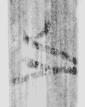之
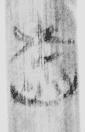本B（本）
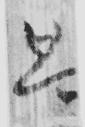也
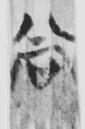尚
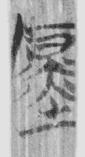廛
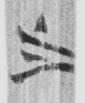之
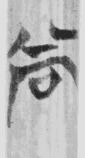尚
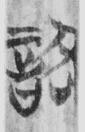詻
